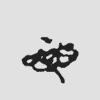𡄹
